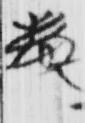慶
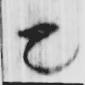乙
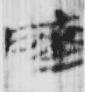陵
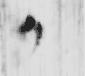人
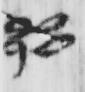郘
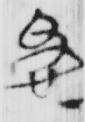快
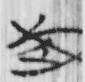武
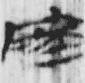陵
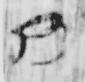尹
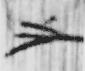之
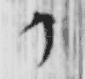人
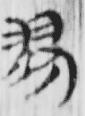翏
